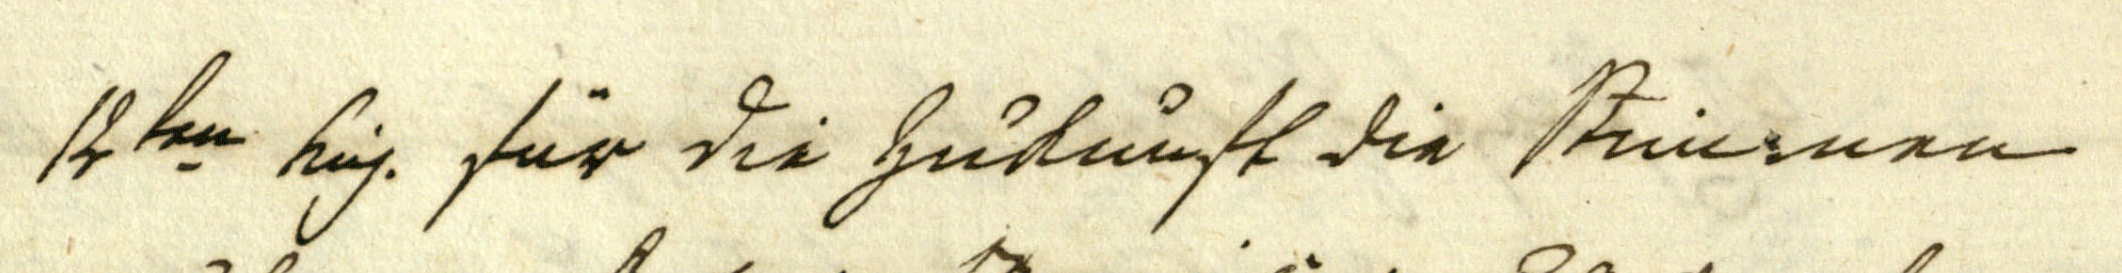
12 ten huj. für die Zukunft die Stimmen
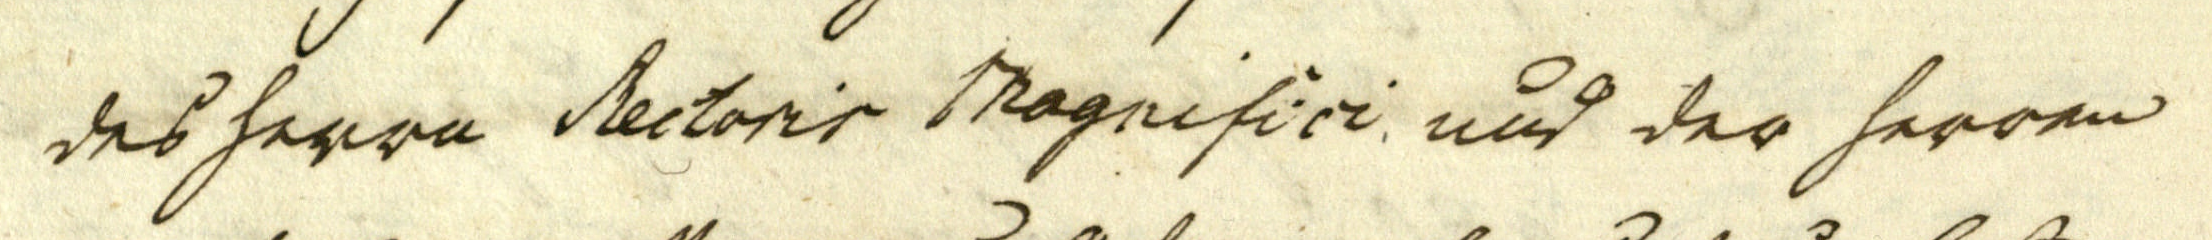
des Herrn Rectoris Magnifici und der Herren
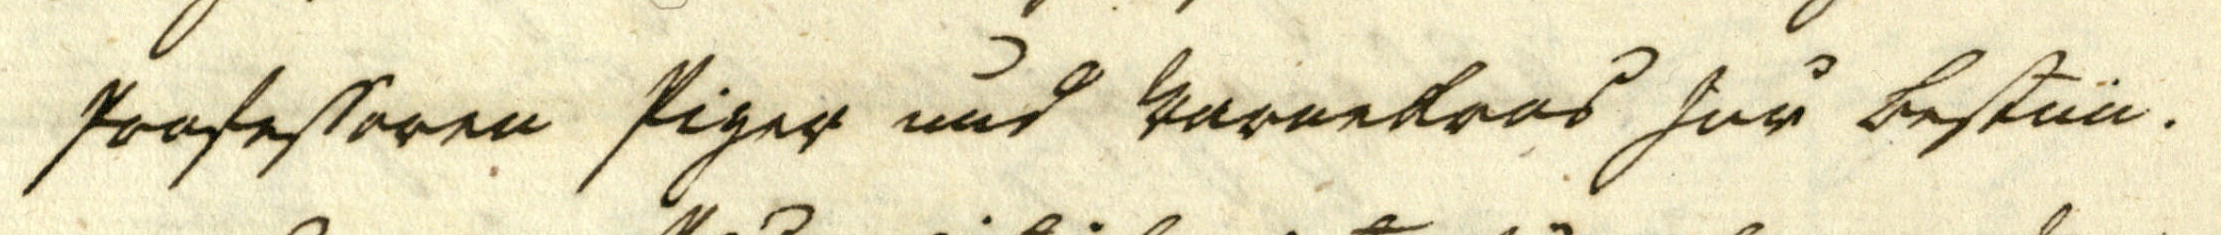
Professoren Piper und Warnekros zur Bestim¬
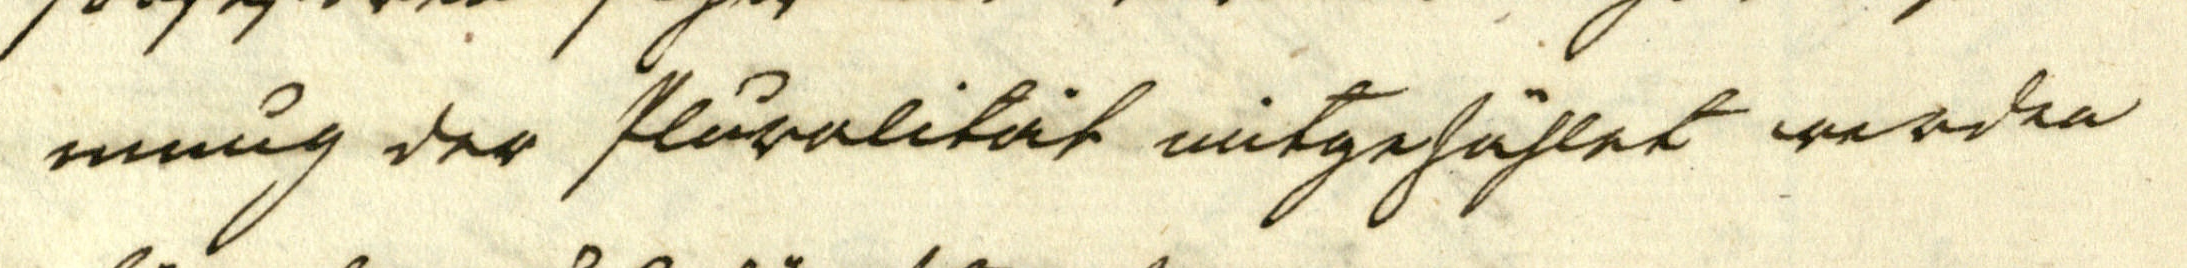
mung der Pluralität mitgezählet werden
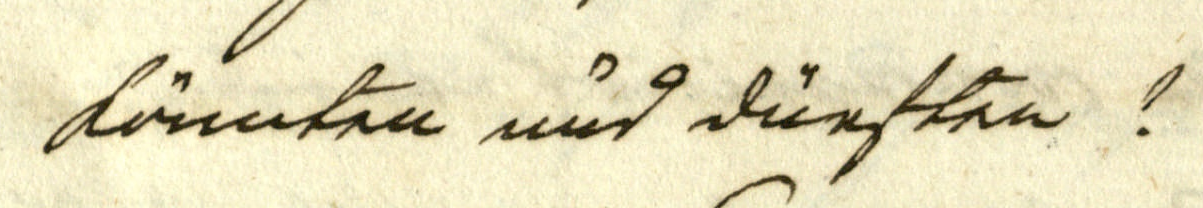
könnten und dürften?
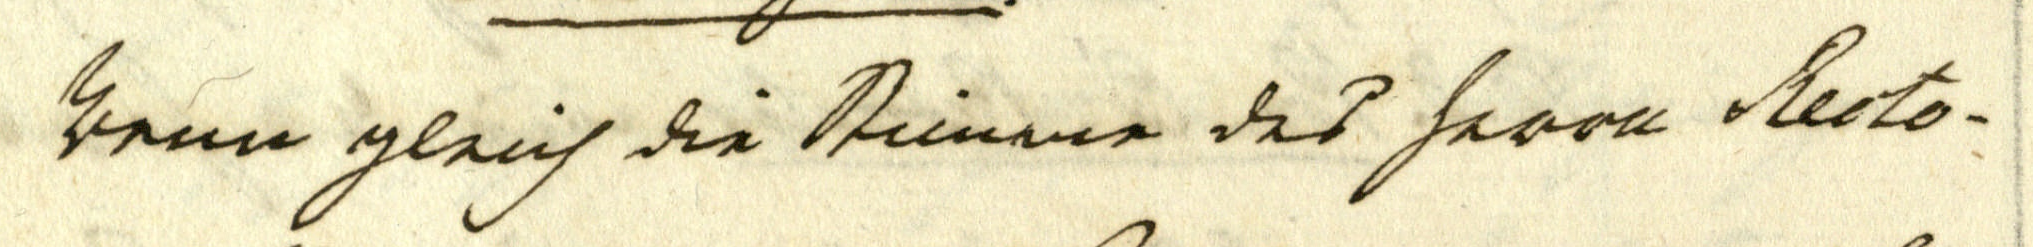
Wenn gleich die Stimme des Herrn Recto¬
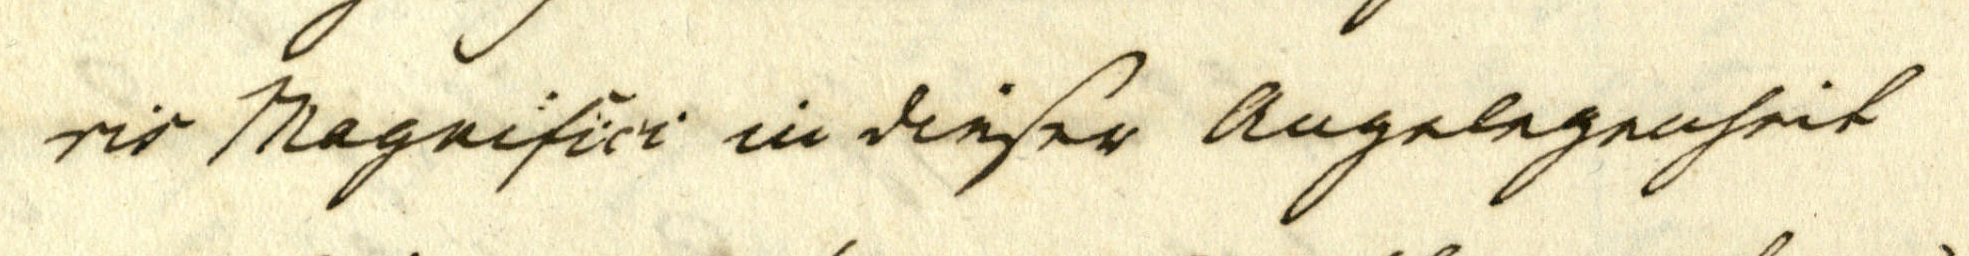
ris Magnifici in dieser Angelegenheit
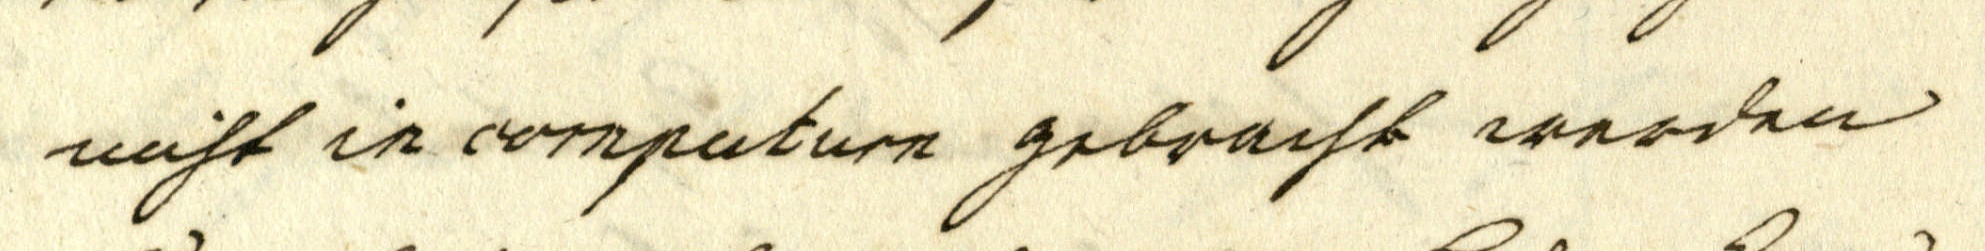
nicht in computum gebracht werden
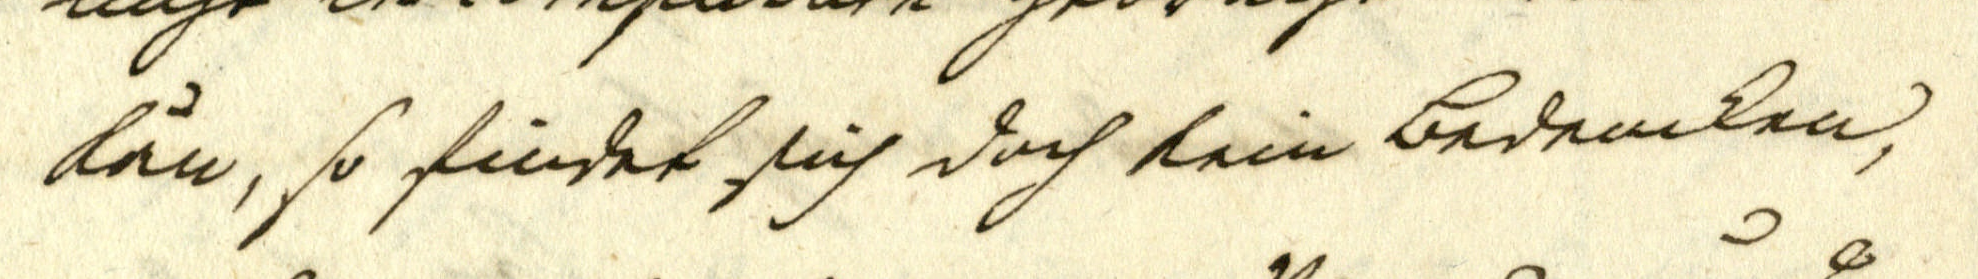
kan, so findet sich doch kein Bedencken,
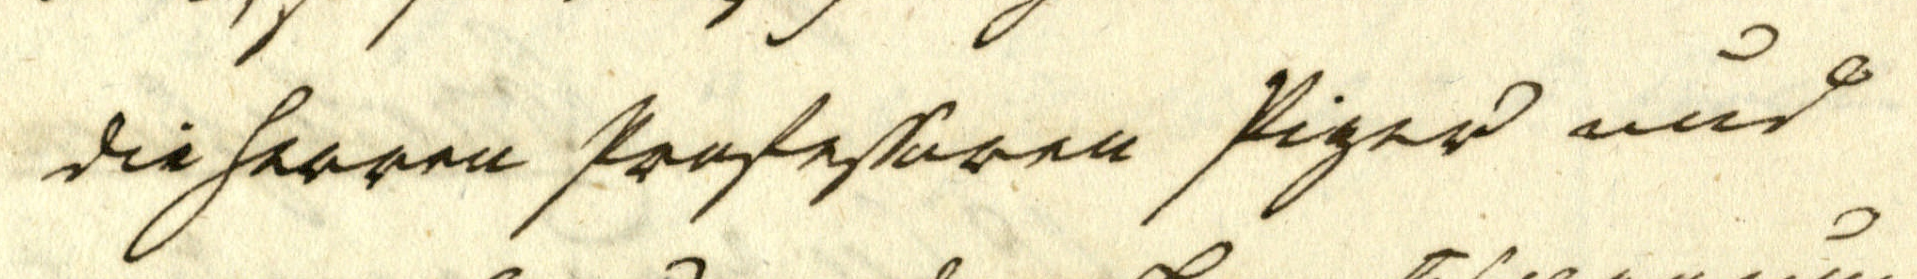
die Herren Professoren Piper und
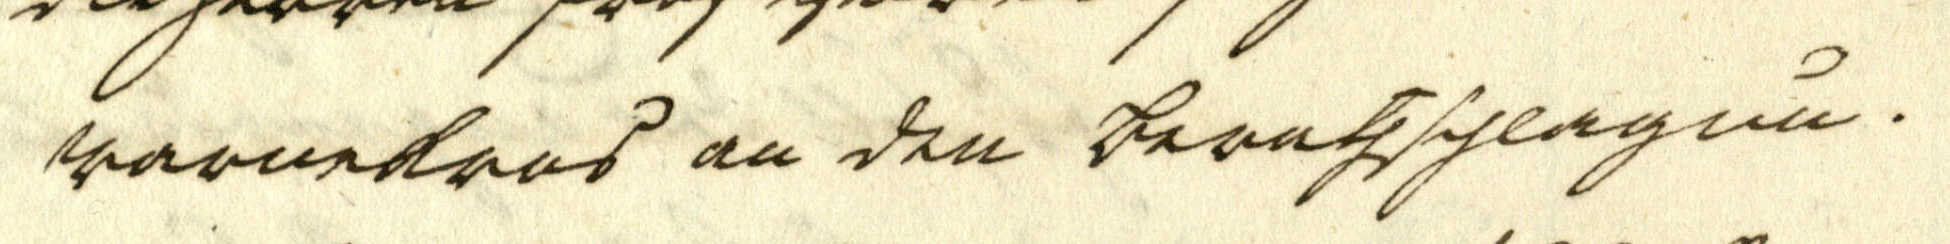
Warnekros an den Berathschlagun¬
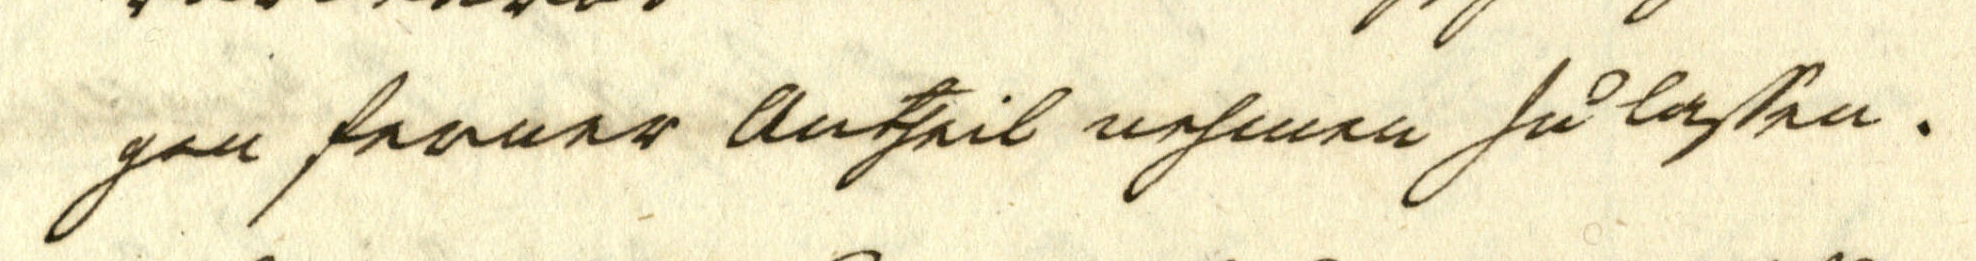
gen ferner Antheil nehmen zu lassen.
